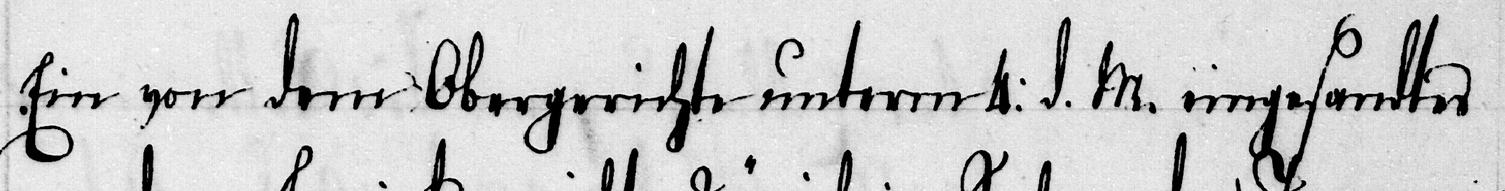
Ein von dem Obergerichte unterm 4: d. M. eingesandtes
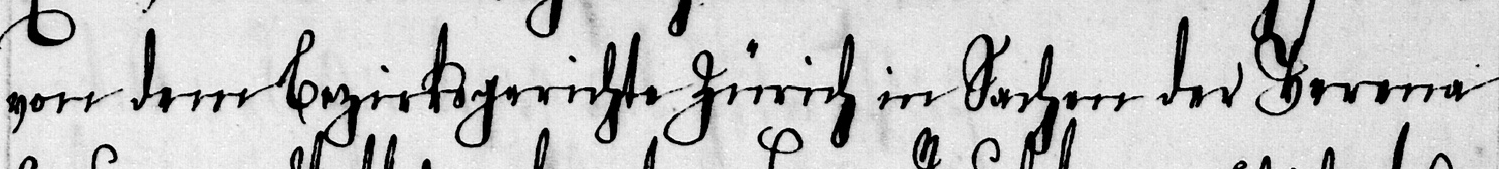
von dem Bezirksgerichte Zürich in Sachen der Verena
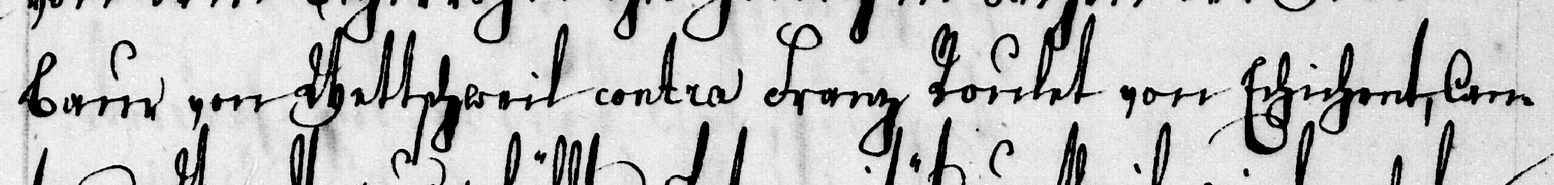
Baur von Wettschweil contra Franz Roulet von Echichent, Can¬
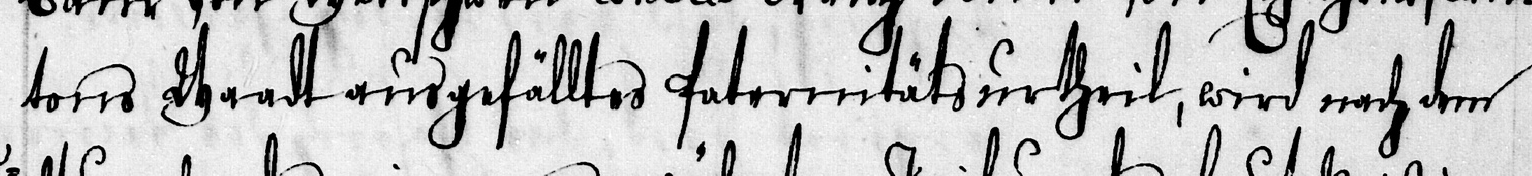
tons Waadt ausgefälltes Paternitätsurtheil, wird nach dem
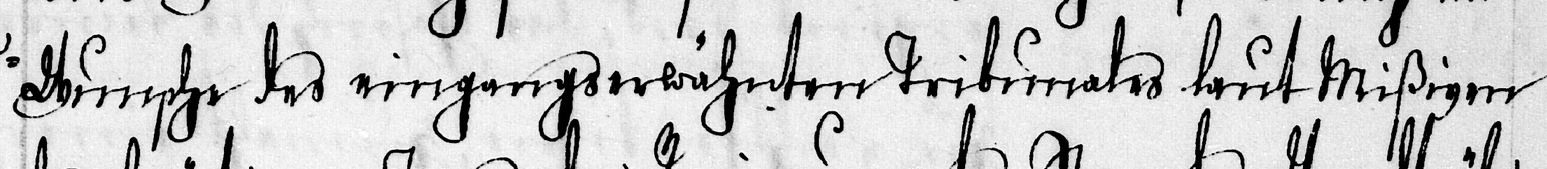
Wunsche des eingangserwähnten Tribunales laut Mißiven
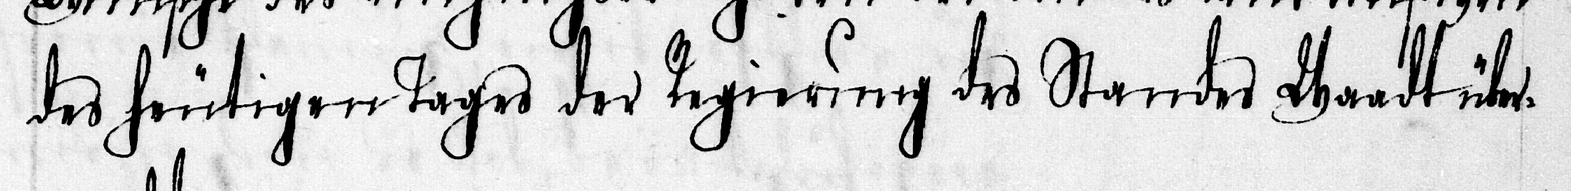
des heutigen Tages der Regierung des Standes Waadt über¬
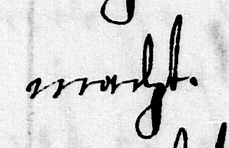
macht.
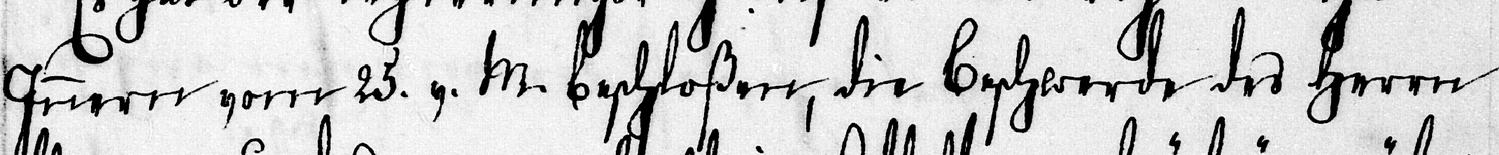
Innern vom 25. v. M. beschloßen, die Beschwerde des Herrn
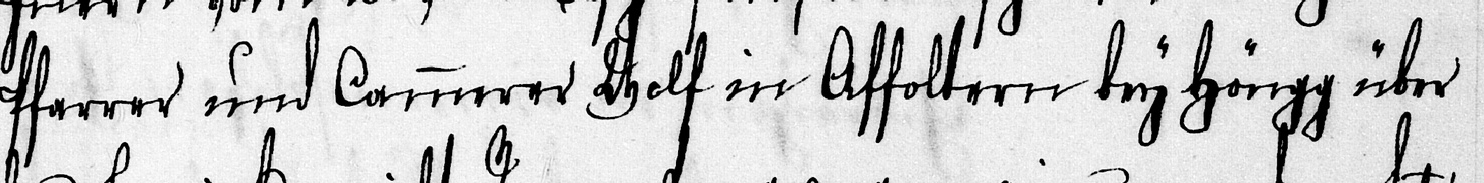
Pfarrer und Cammerer Wolf in Affoltern bey Höngg über
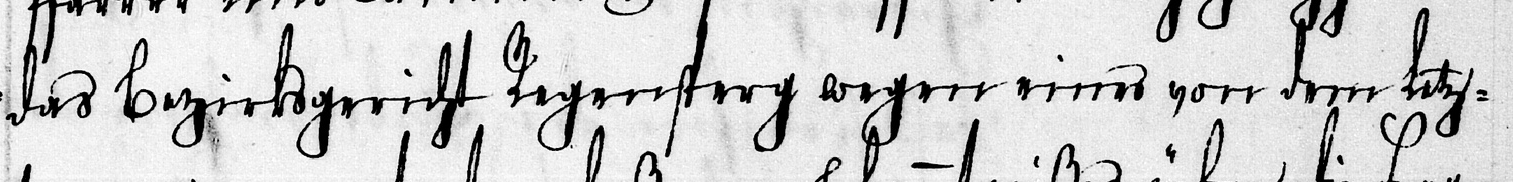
das Bezirksgericht Regensperg wegen eines von dem Letz¬
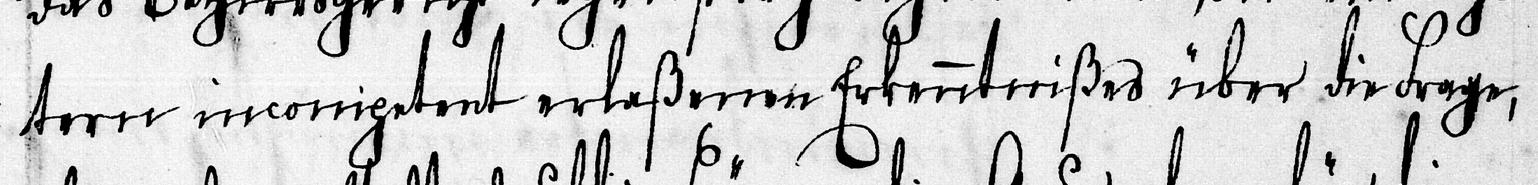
tern incompetent erlaßenen Erkentnißes über die Frage,
